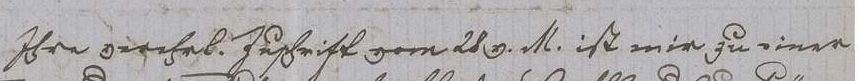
Ihre verehrl. Zuschrift vom 28 v. M. ist mir zu einer
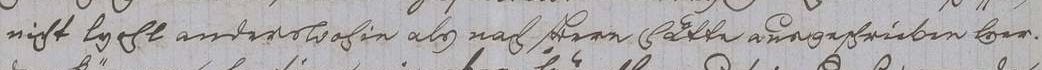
nicht wohl anderswohin als nach Bern hätte ausgeschrieben wer-
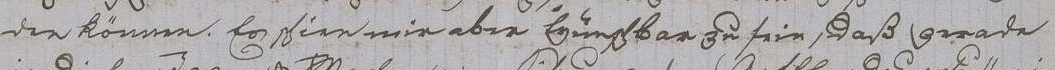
den können. Es schien mir aber wünschbar zu sein, daß gerade
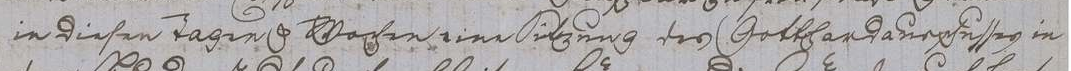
in diesen Tagen & Wochen eine Sitzung des Gotthardausschusses in
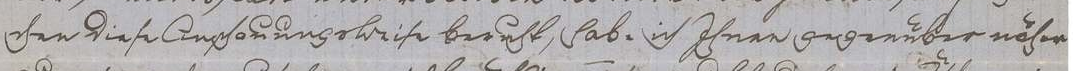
chen diese Anschauungsweise beruht, habe ich Ihnen gegenüber näher
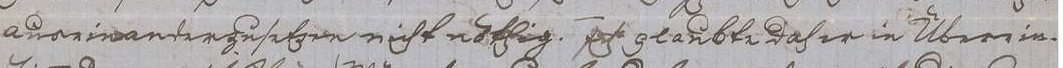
auseinanderzusetzen nicht nöthig. Ich glaubte daher in Überein-
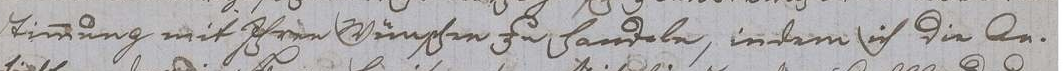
stimmung mit Ihren Wünschen zu handeln, indem ich die An-
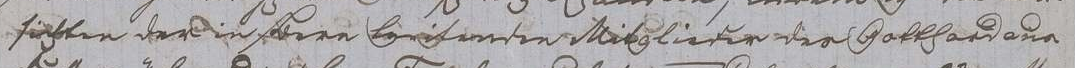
sichten der in Bern weilenden Mitglieder des Gotthardaus-
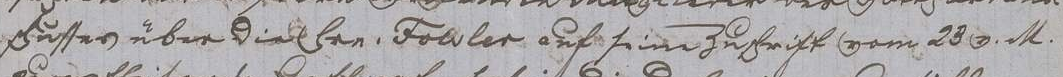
schusses über die Hrn. Fowler auf seine Zuschrift vom 23 v. M.
